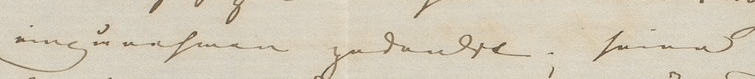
einzunehmen gedenkt; seine
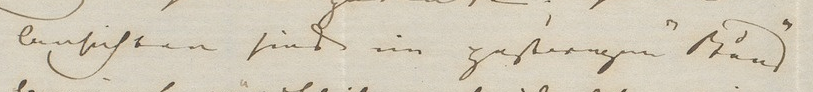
Ansichten sind im gestrigen «Bund»
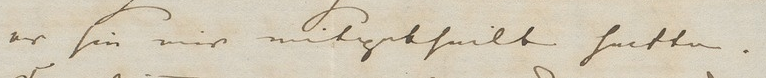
er sie mir mitgetheilt hatte.
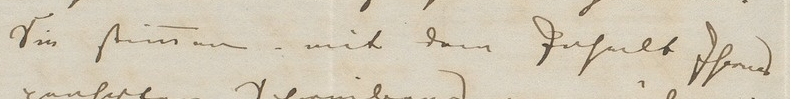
Sie stimmen mit dem Inhalt Ihres
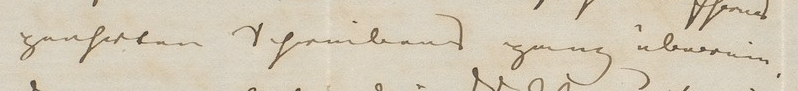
geehrten Schreibens ganz überein,
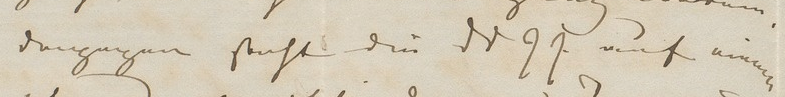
dagegen steht die NZZ. auf einem
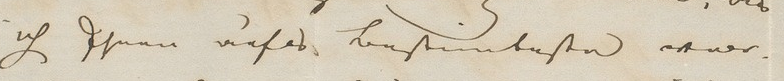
ich Ihnen aufs Bestimteste ver-
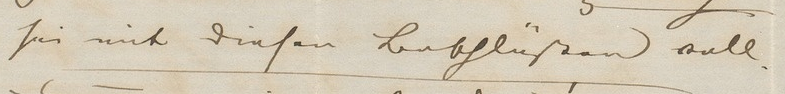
sei mit diesen Beschlüßen voll-
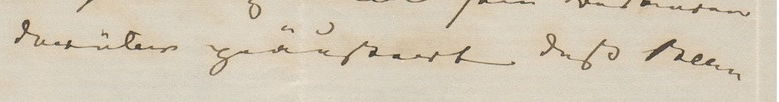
darüber geäußert, daß Bern
